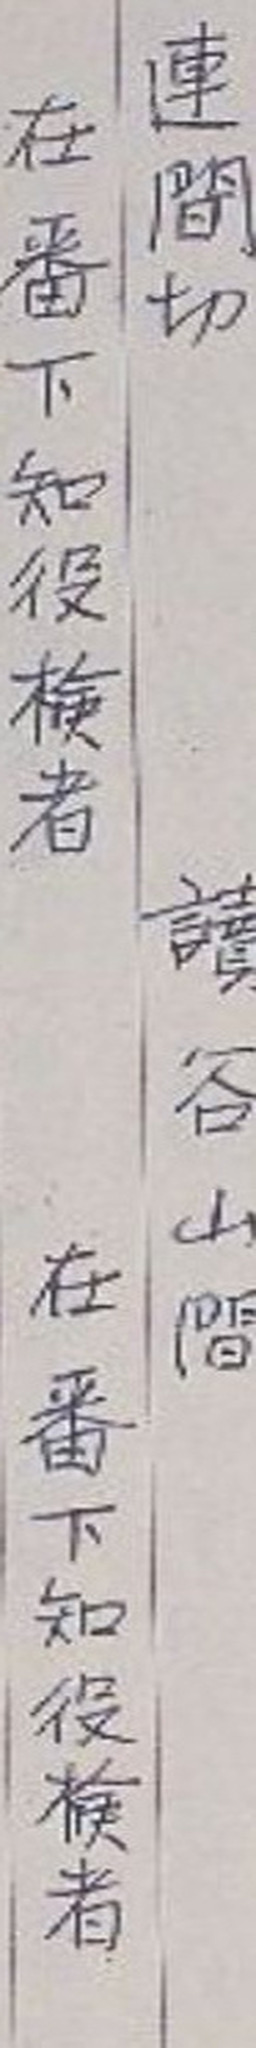在番下知役検者在番下知役検者
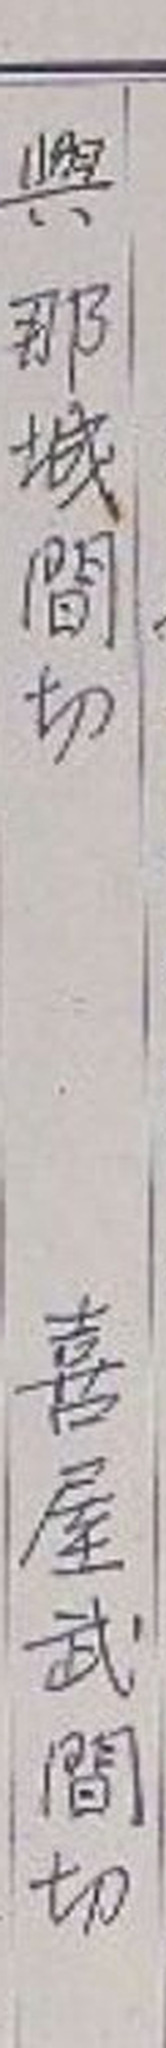与那城間切喜屋武間切
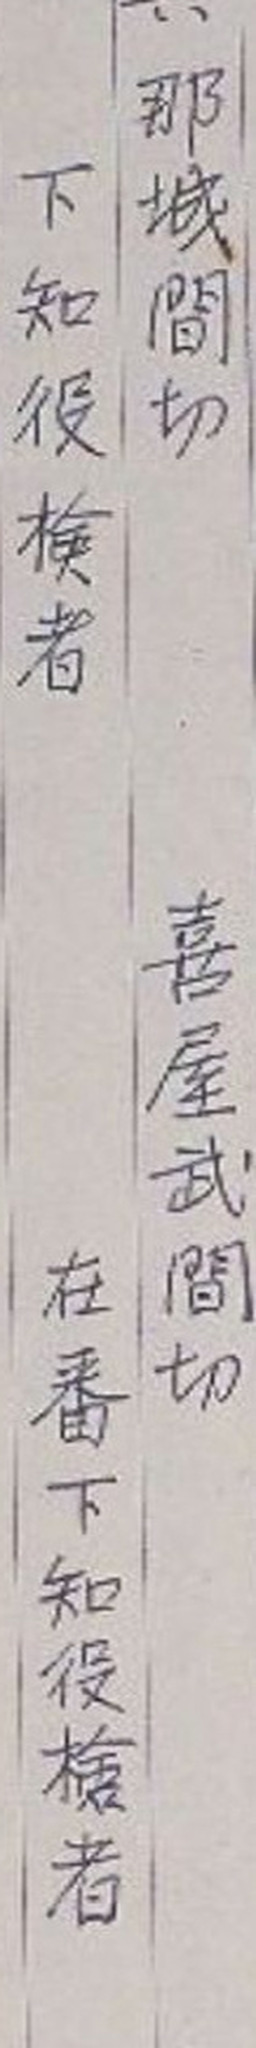下知役検者在番下知役検者

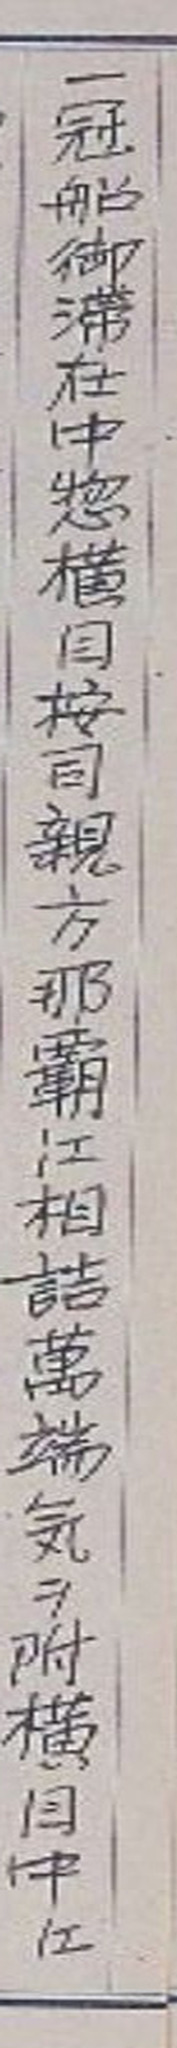一冠船御滞在中惣横目按司親方那覇え相詰万端気を附横目中え
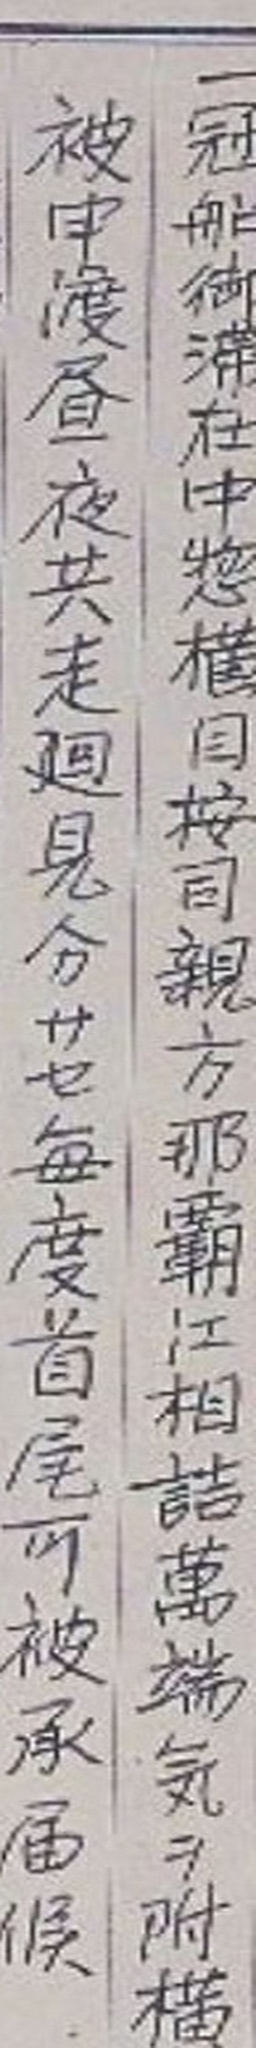被申渡昼夜共走廻見分させ毎度首尾可被承届候
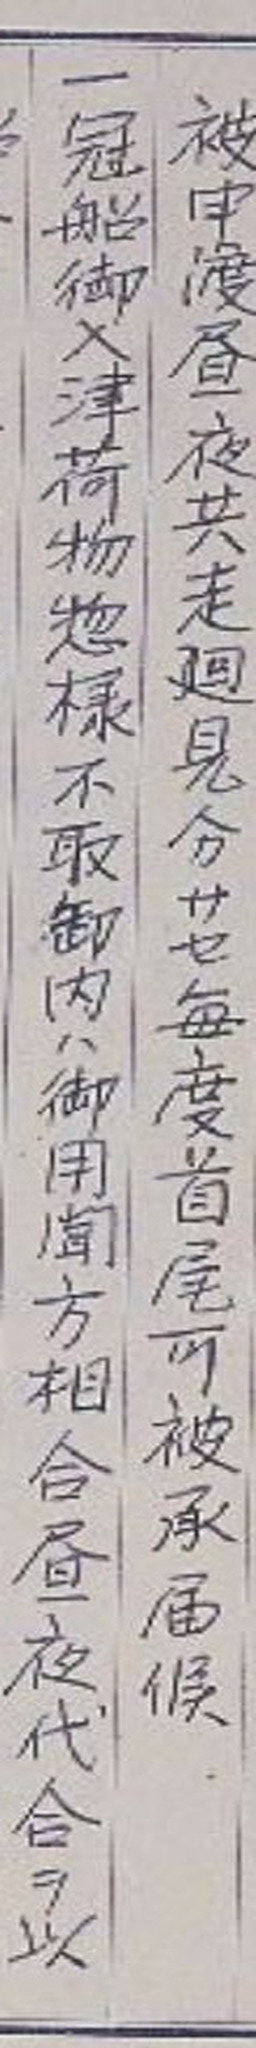一冠船御入津荷物惣様不取御内は御用聞方相合昼夜代合を以
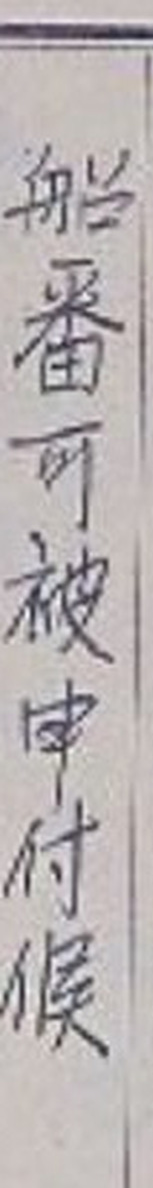船番可被申付候
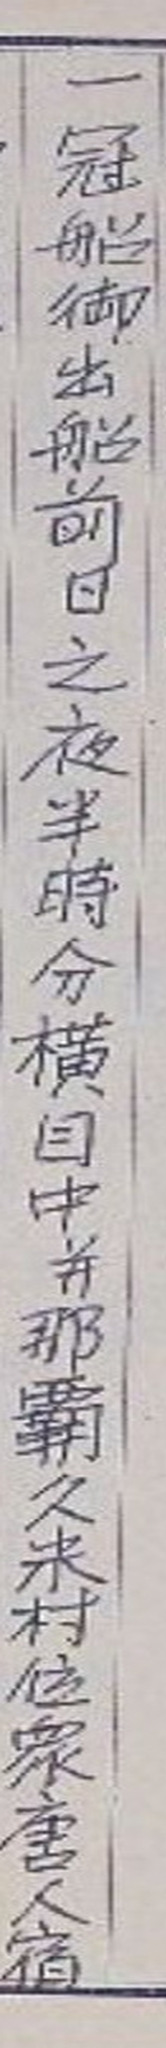一冠船御出船前日之夜半時分横目中并那覇久米村位衆唐人宿
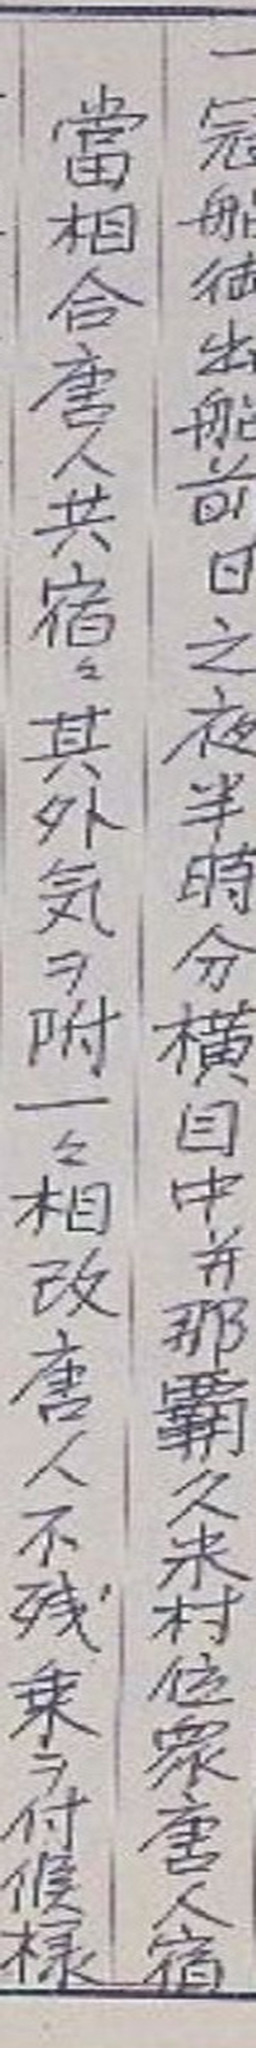当相合唐人共宿々其外気を附一々相改唐人不残乗を付候様
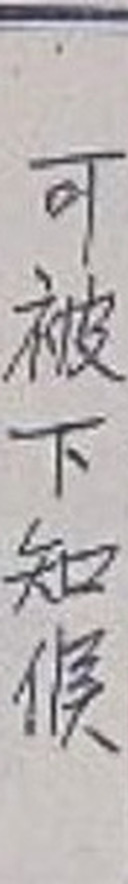可被下知候
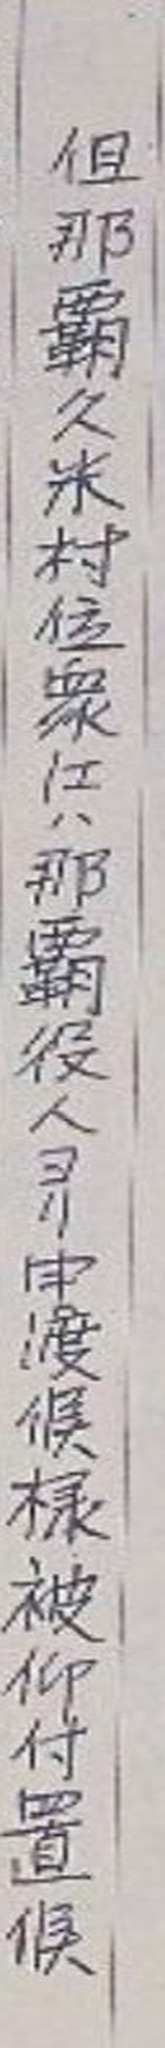但那覇久米村位衆えは那覇役人より申渡候様被仰付置候
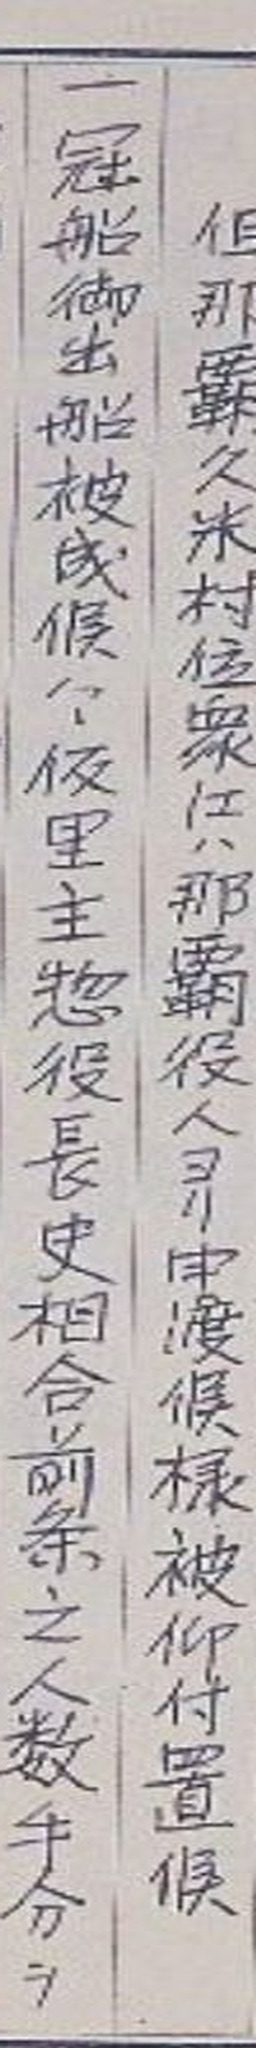一冠船御出船被成候はゝ仮里主惣役長史相合前条之人数手分を
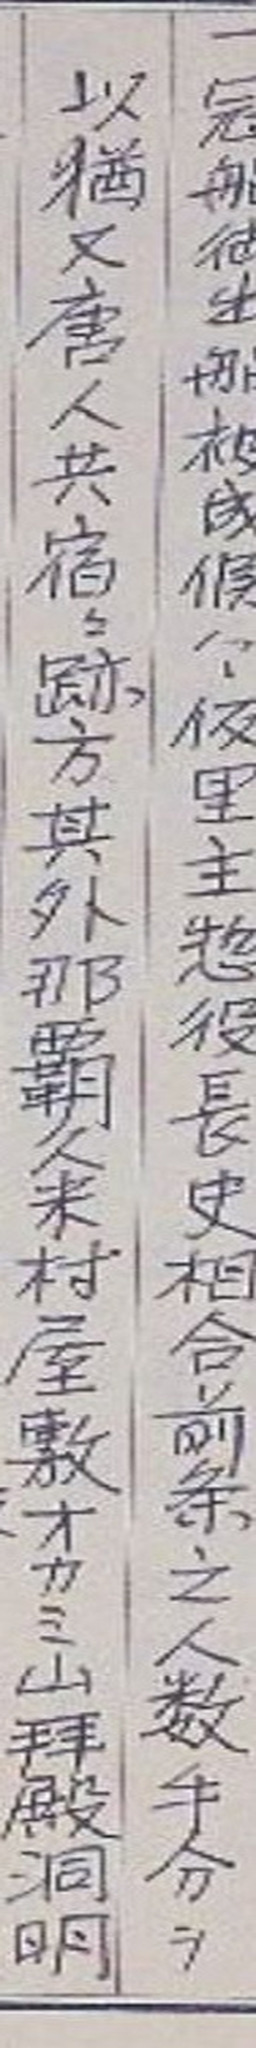以猶又唐人共宿々跡方其外那覇久米村屋敷おかみ山拝殿洞明
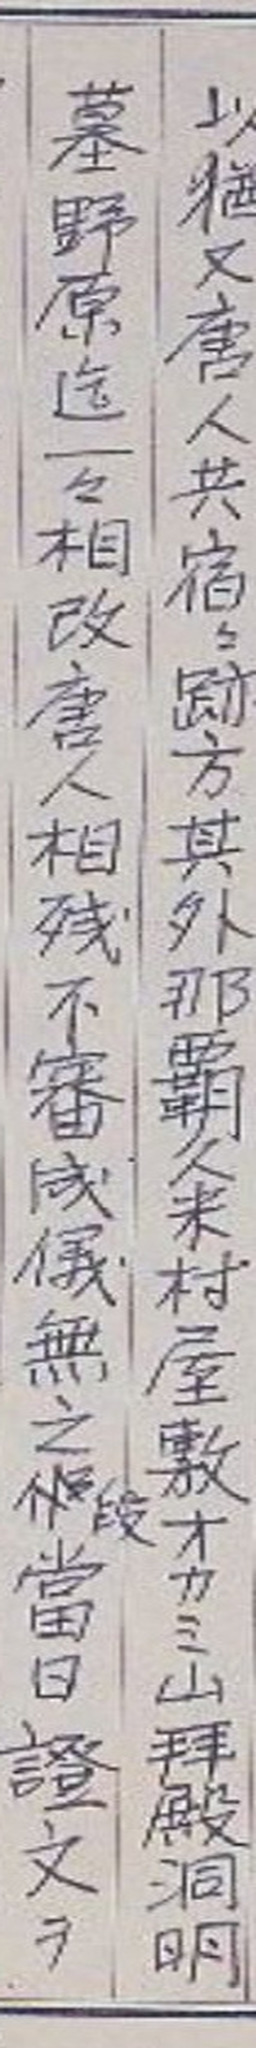墓野原迄一々相改唐人相残不審成儀無之段当日証文を
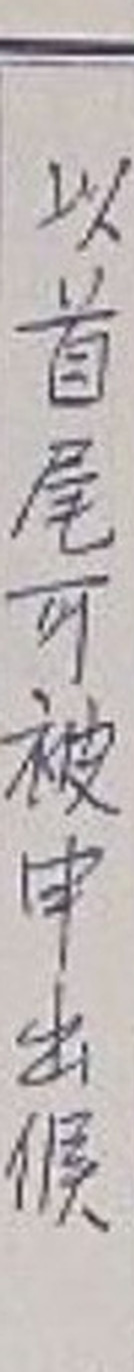以首尾可被申出候
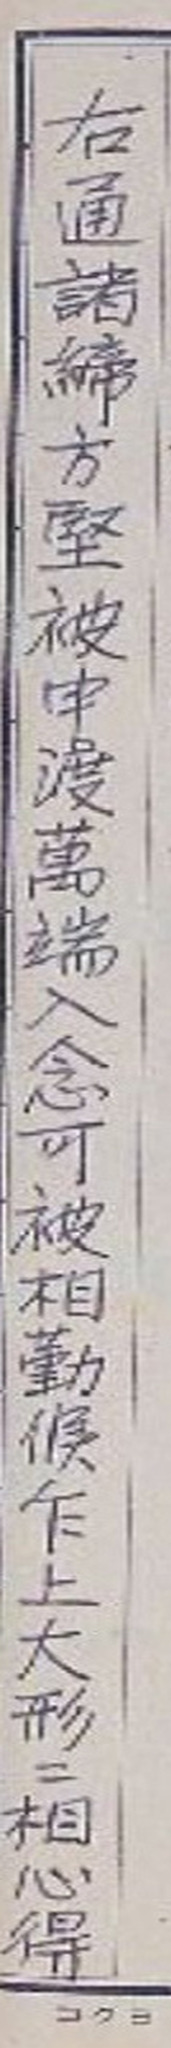右通諸締方堅被申渡万端入念可被相勤候乍上大形に相心得
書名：支那冊封使来琉諸記 下巻
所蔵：University of the Ryukyus Library
